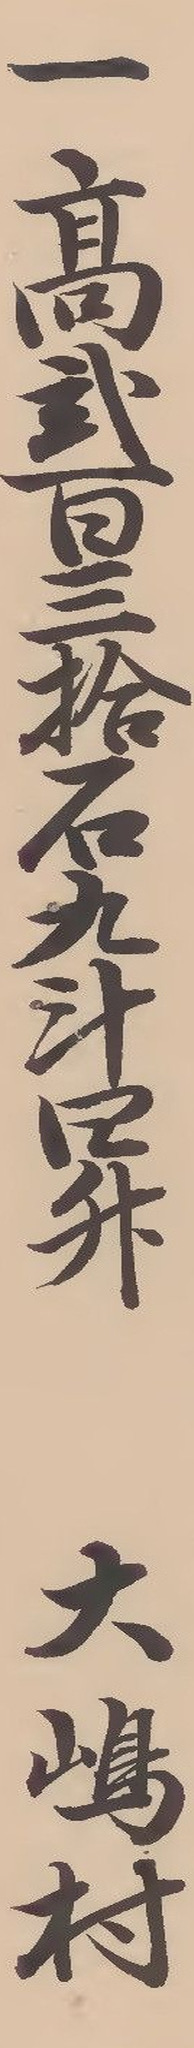一高弐百三拾石九斗四升大島村

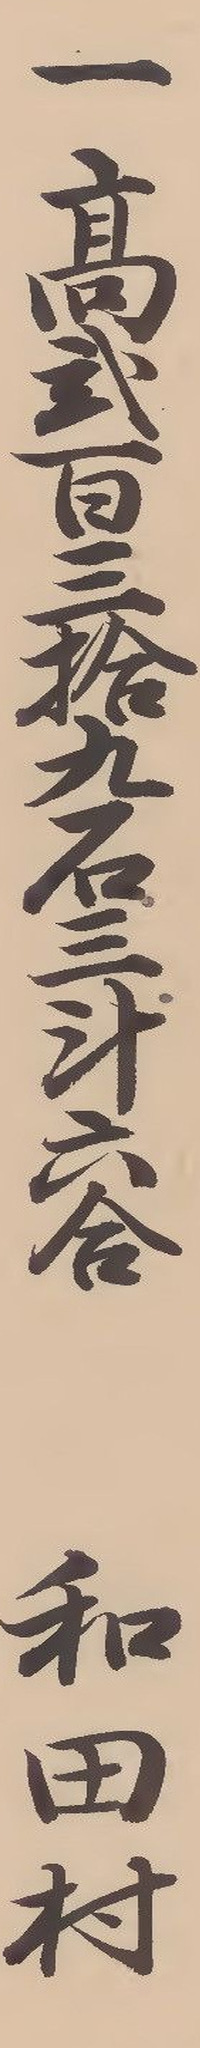一高弐百三拾九石三斗六合和田村
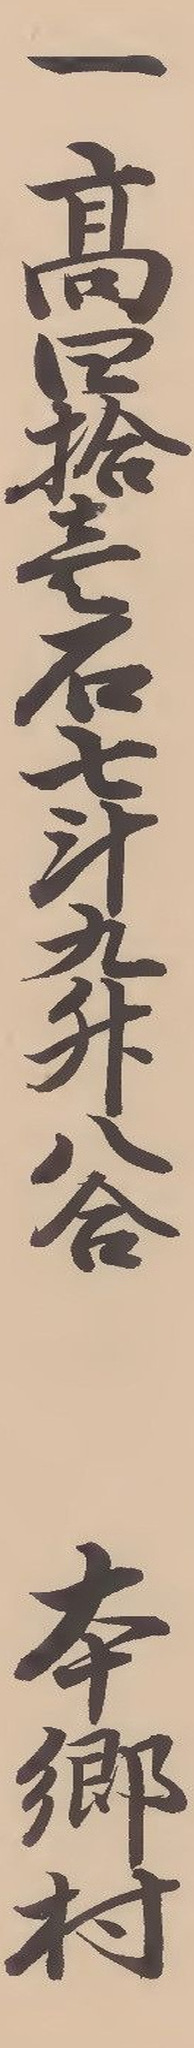一高四拾壱石七斗九升八合本郷村
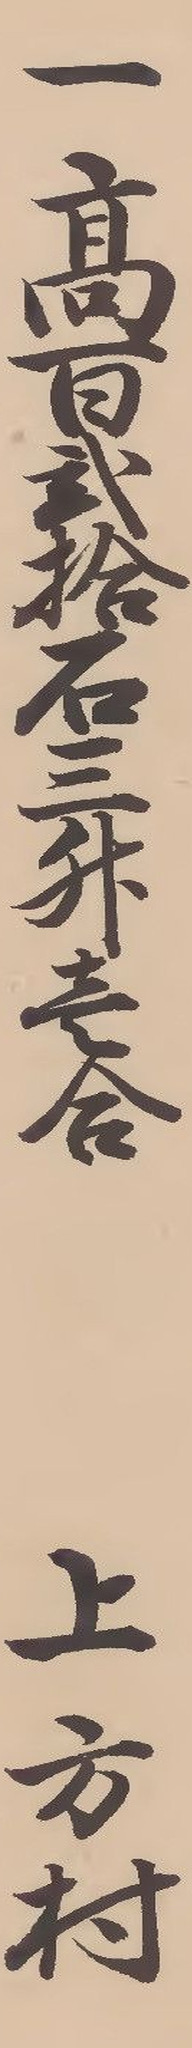一高百弐拾石三升壱合上方村
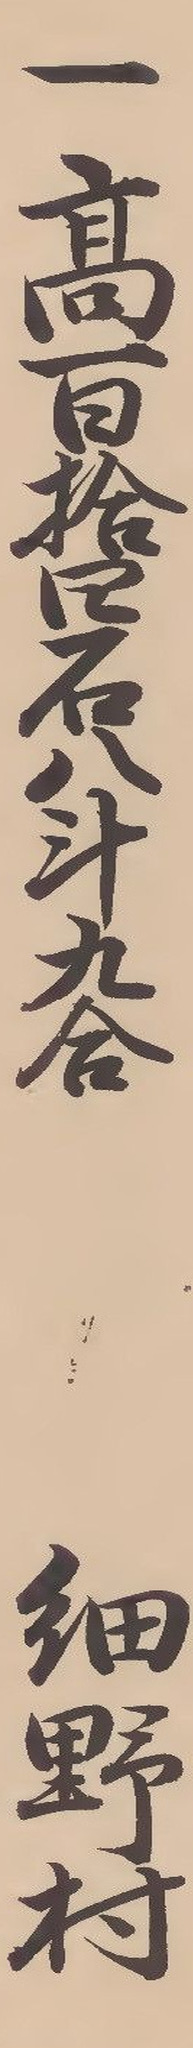一高百拾四石八斗九合細野村
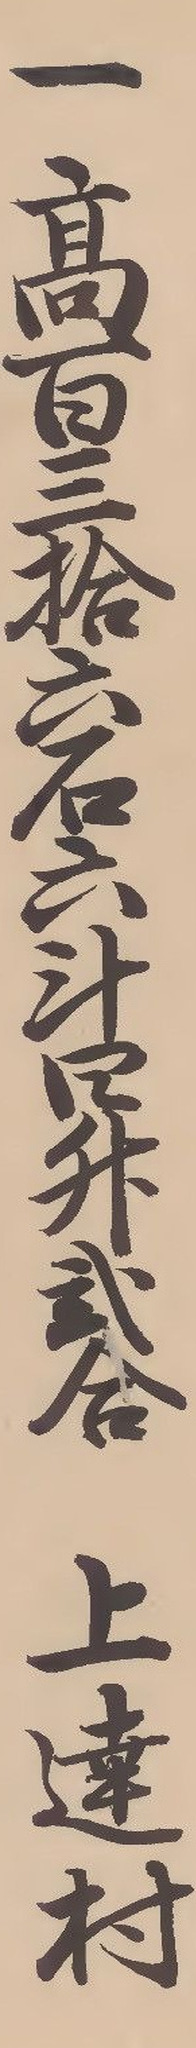一高百三拾六石六斗四升弐合上達村
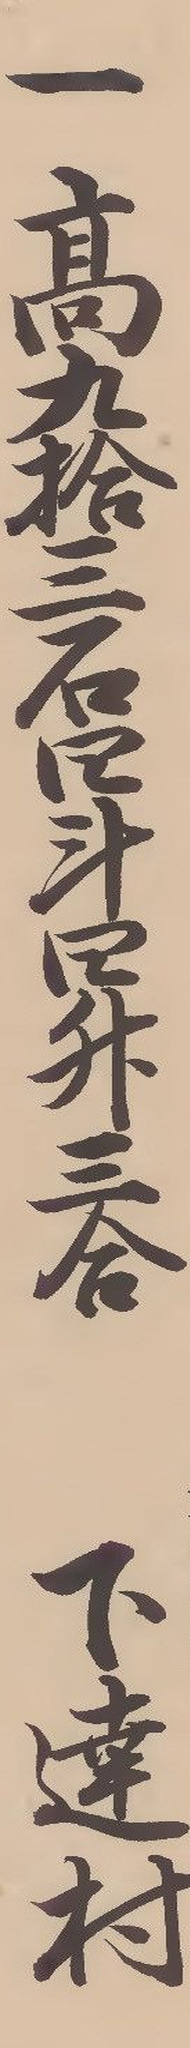一高九拾三石四斗四升三合下達村
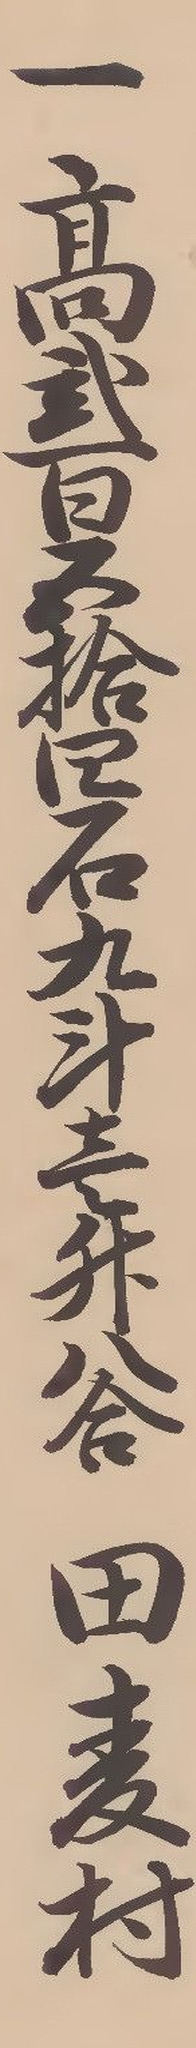一高弐百五拾四石九斗壱升八合田麦村
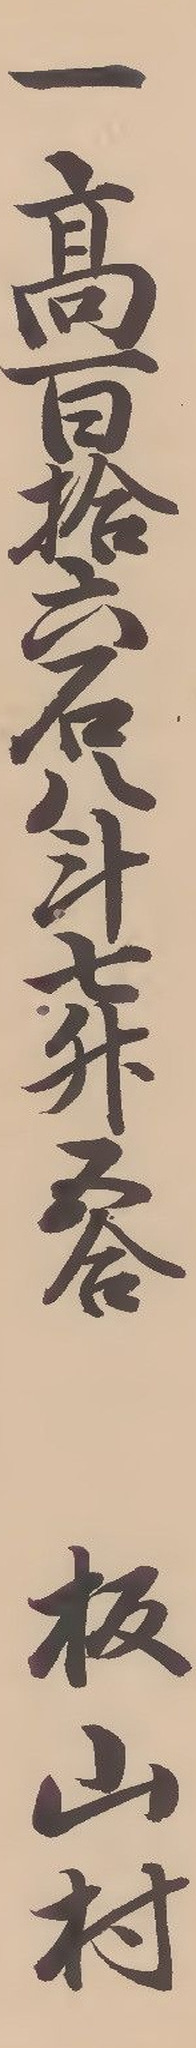一高百拾六石八斗七升五合板山村

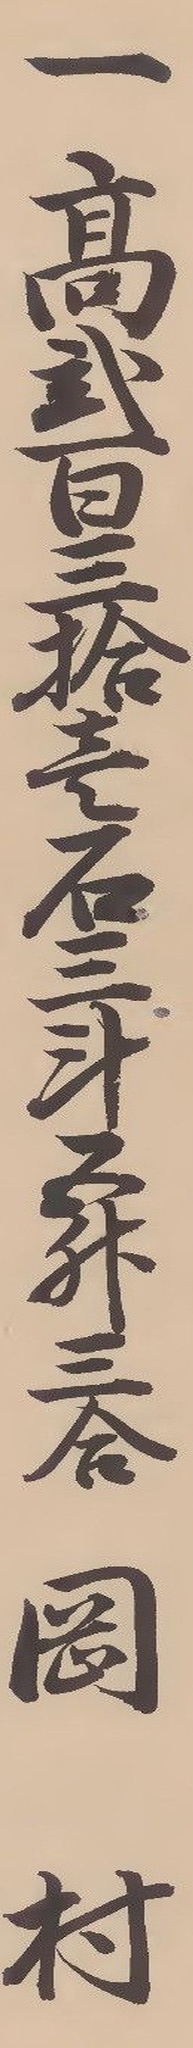一高弐百三拾壱石三斗五升三合岡村
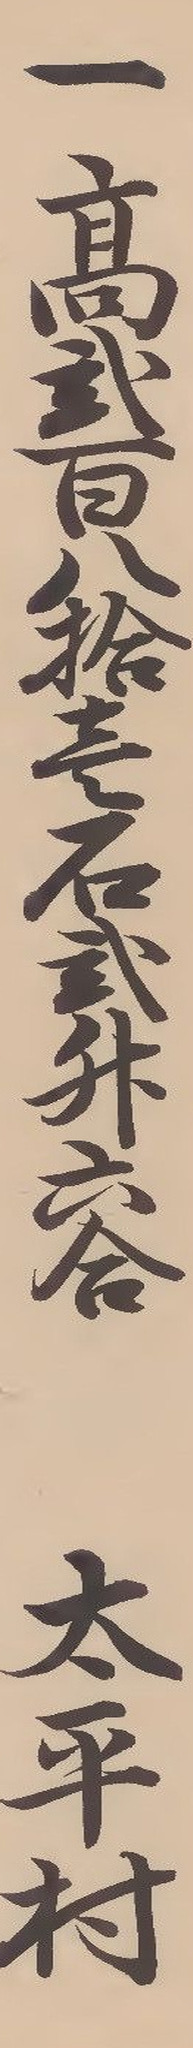一高弐百八拾壱石弐升六合太平村
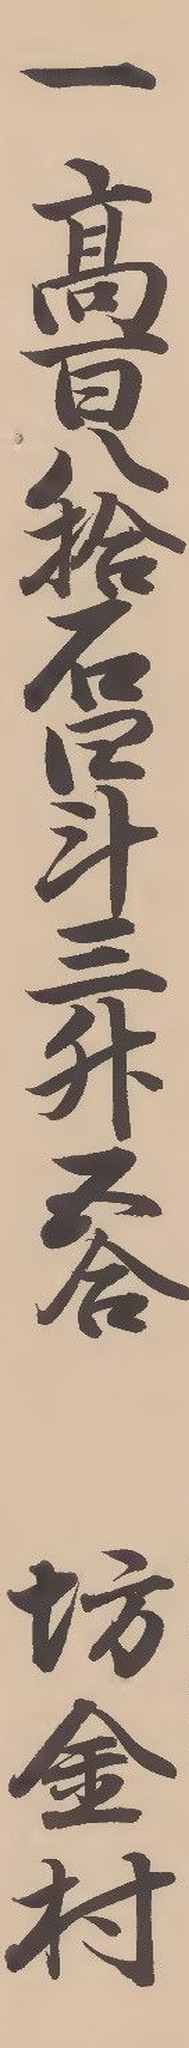一高百八拾石四斗三升五合坊金村
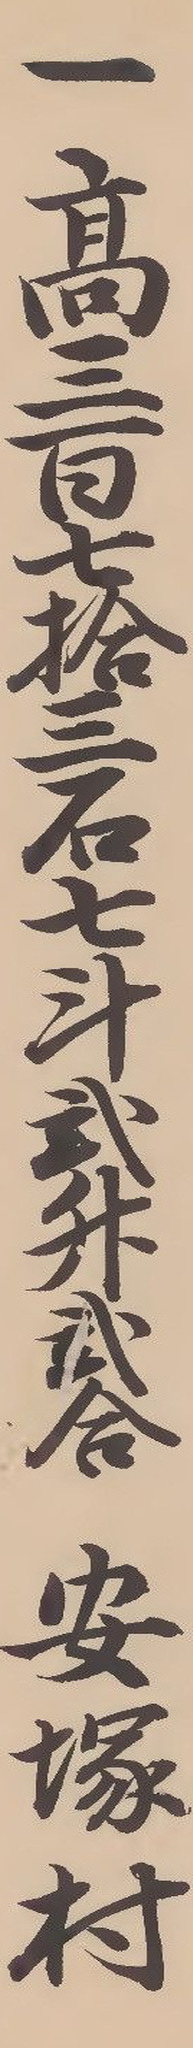一高三百七拾三石七斗弐升弐合安塚村
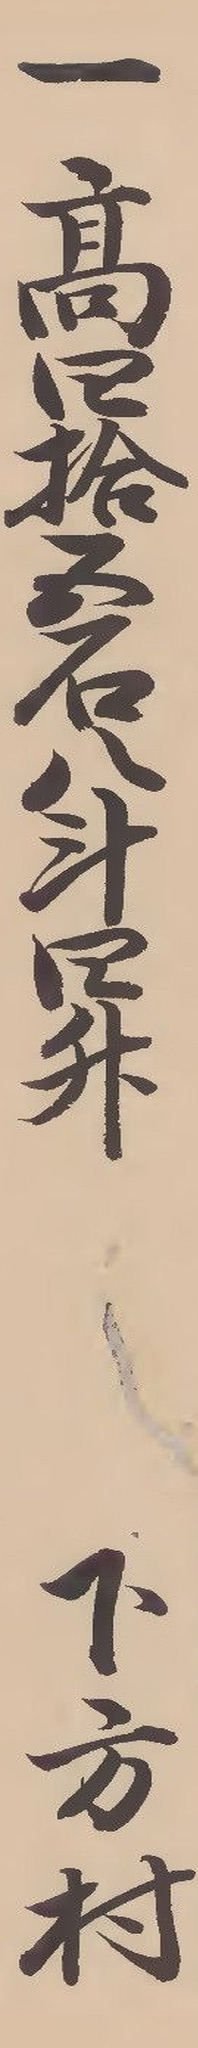一高四拾五石八斗四升下方村
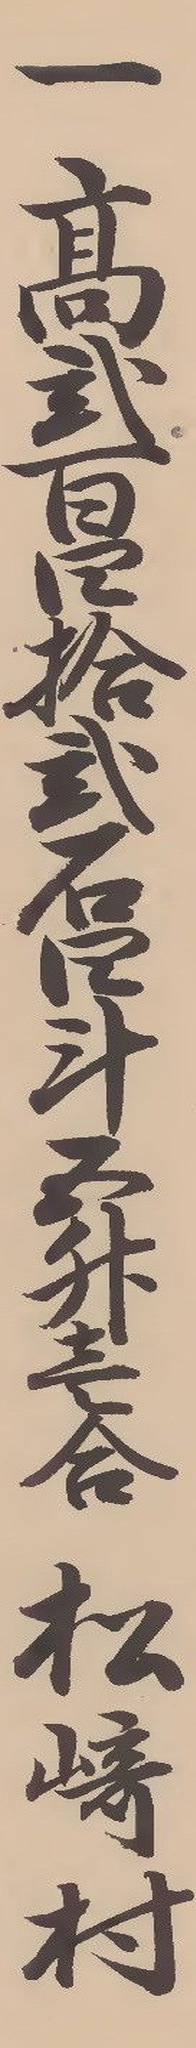一高弐百四拾弐石四斗五升壱合松崎村
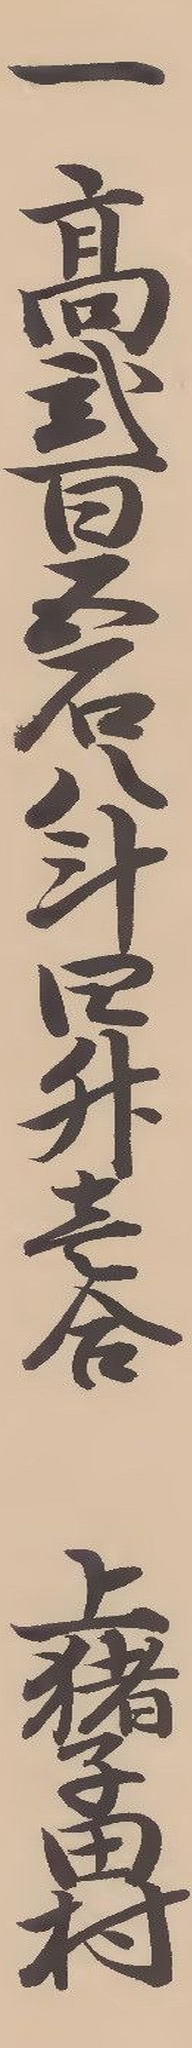一高弐百五石八斗四升壱合上猪子田村
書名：越後国郷帳　上
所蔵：国立公文書館 National Archives of Japan
